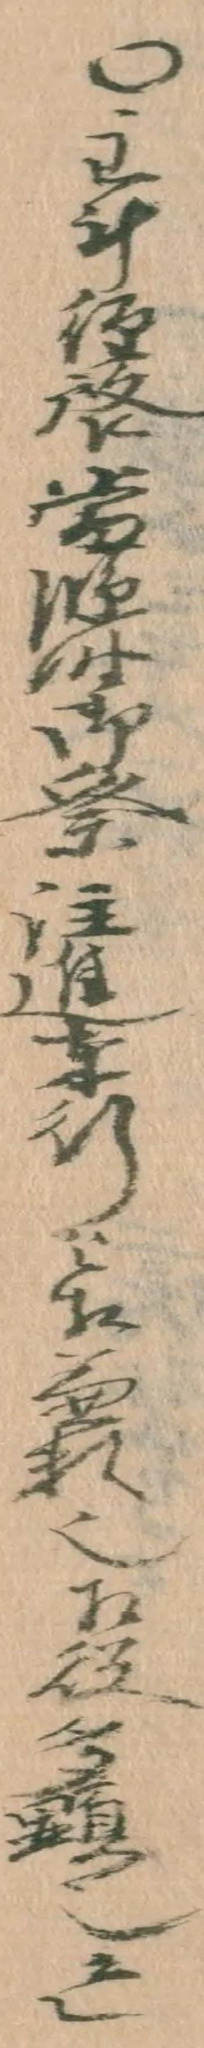○主斗経啓當臨時御祭注進奉行え相兼頼也相役多顕也云々
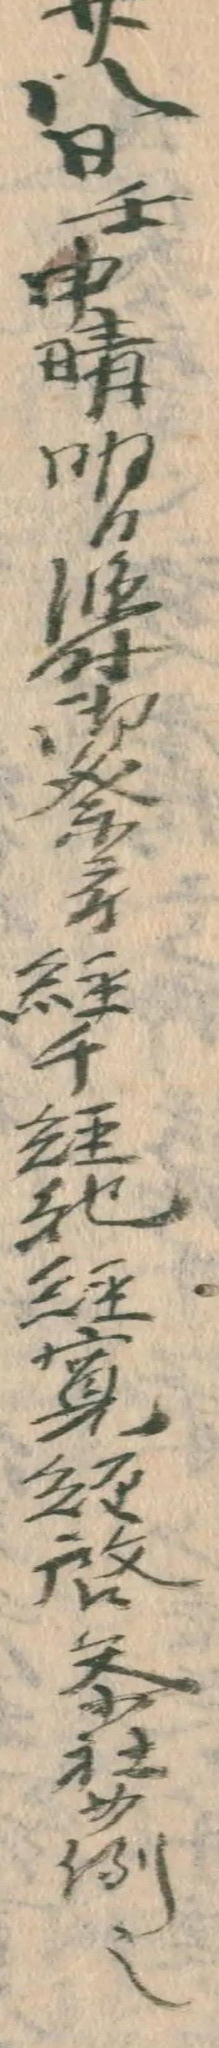廿八日壬申晴明日臨時御祭ニ付経千経紀経啓参社如例也
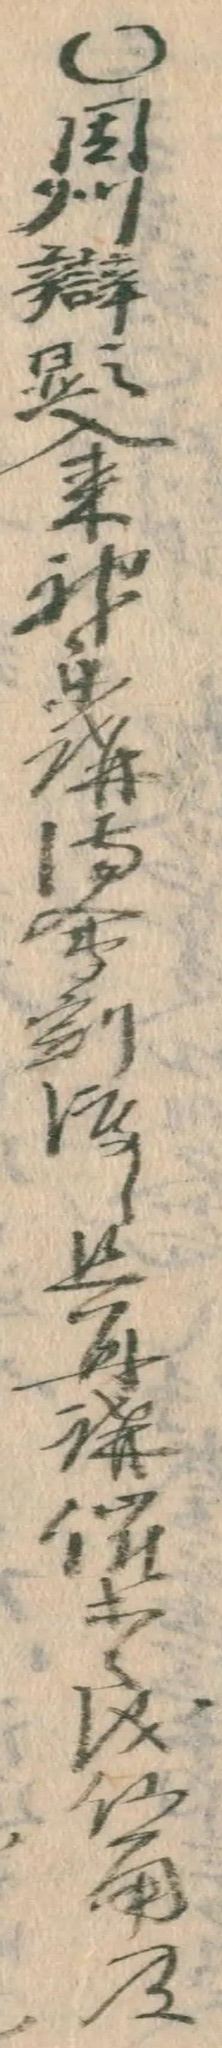○因州辨顕入来神楽構備會割渡し且再講催等之儀何角及
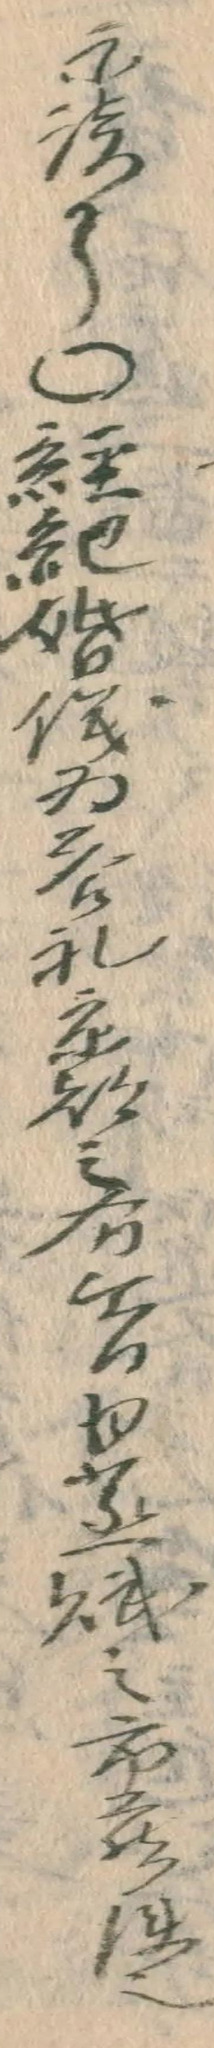示談了○経紀婚儀為答礼京都之分今日白蒸賦之市蔵供也
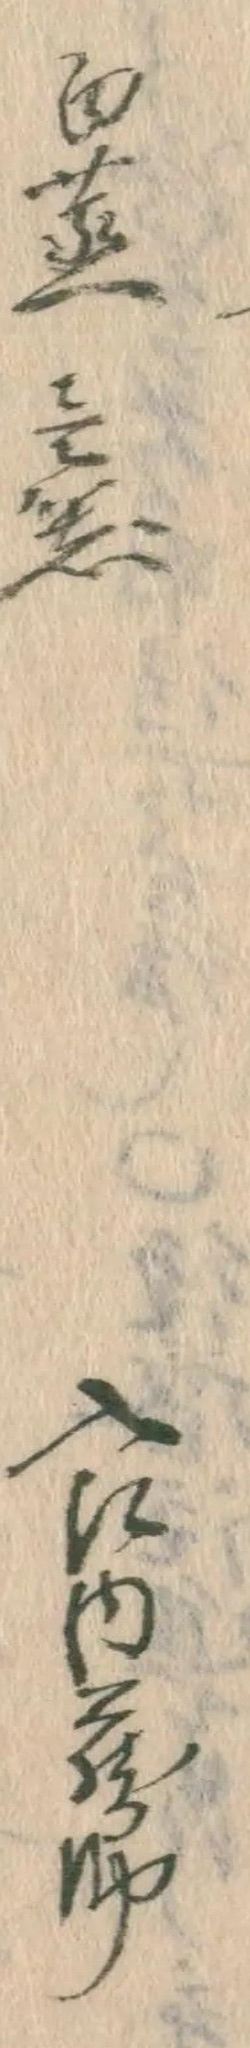白蒸壱器入江内蔵助
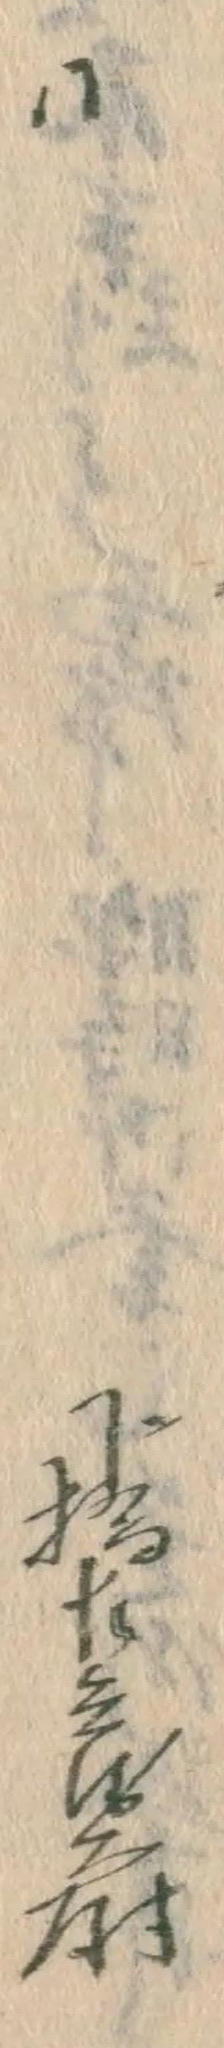同下橋太兵衛尉
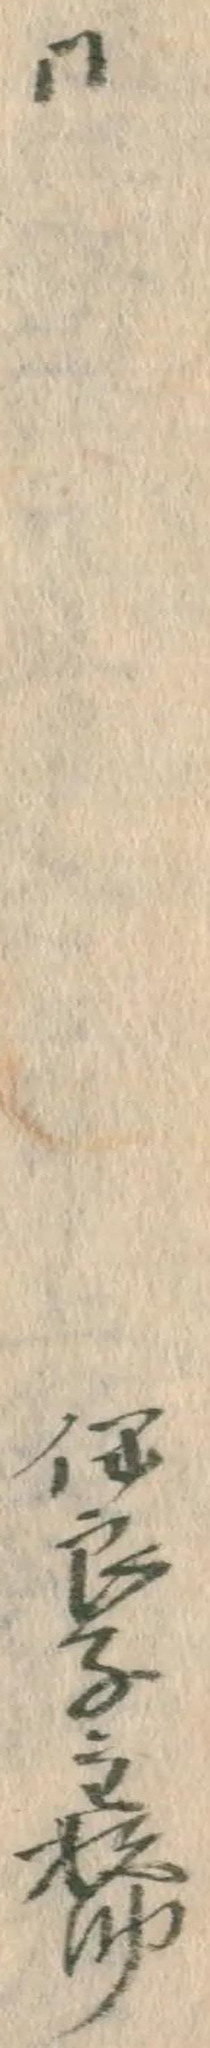同伊良子主税助
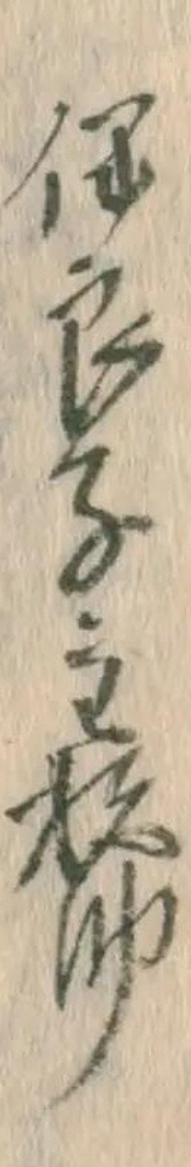同伊良子主税助

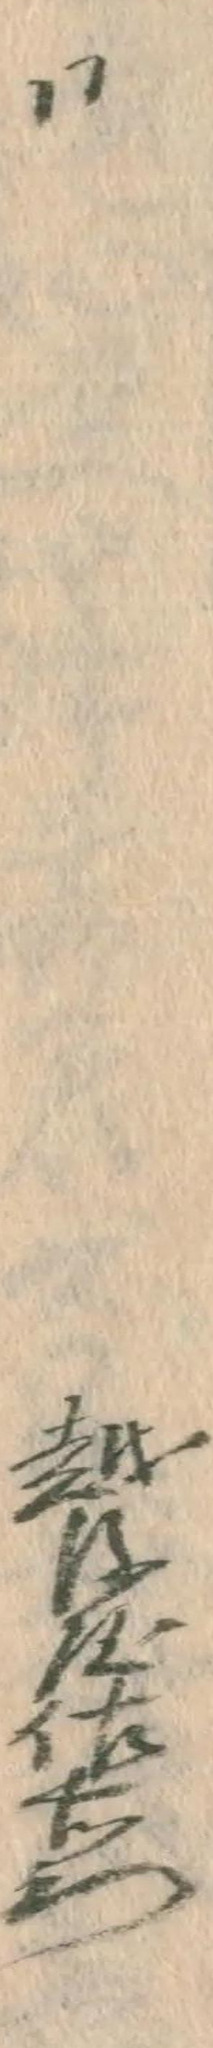同越後屋佐右衛門
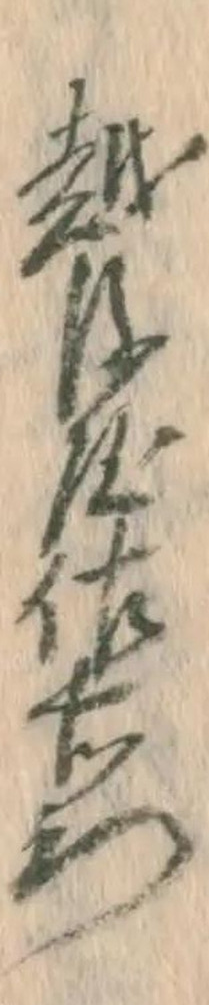同越後屋佐右衛門
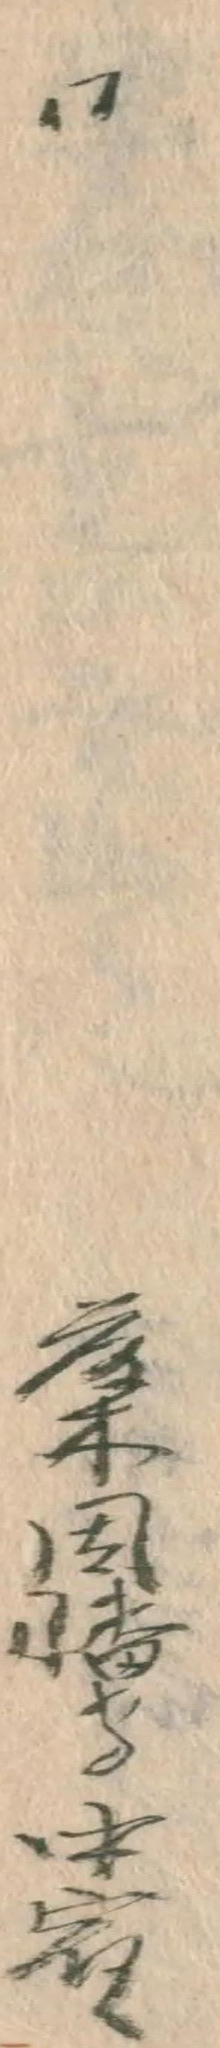同藤木因幡守中宿へ
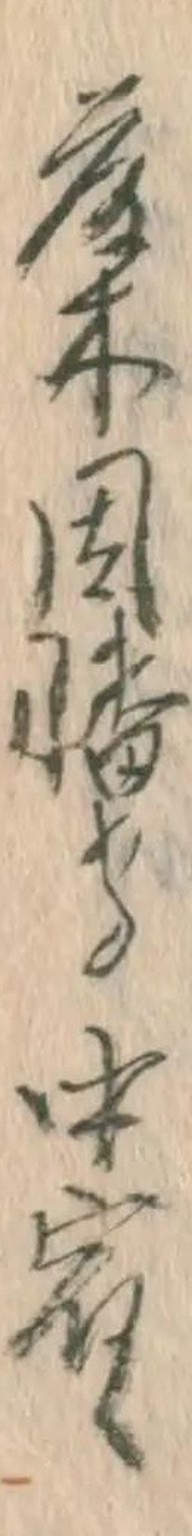同藤木因幡守中宿へ
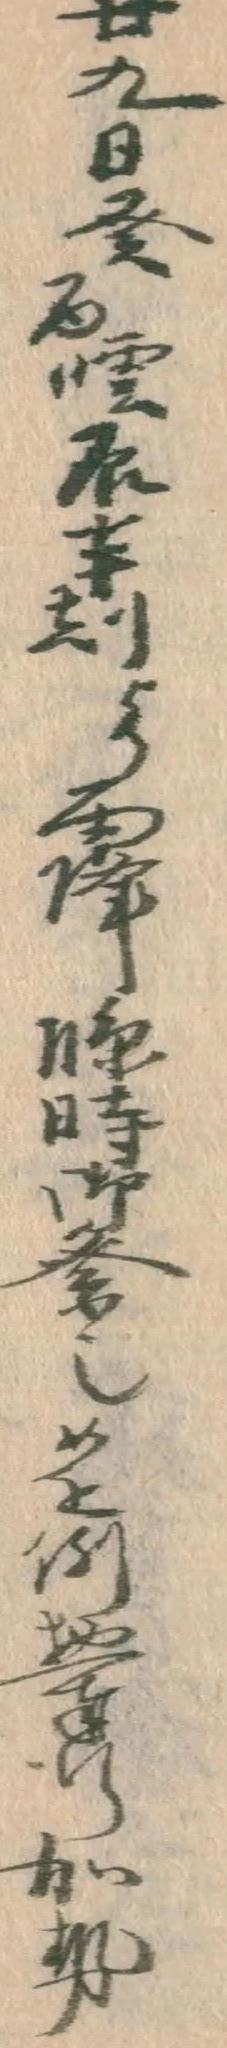廿九日癸酉曇辰半刻より雨降臨時御祭也如近例惣奉行加勢
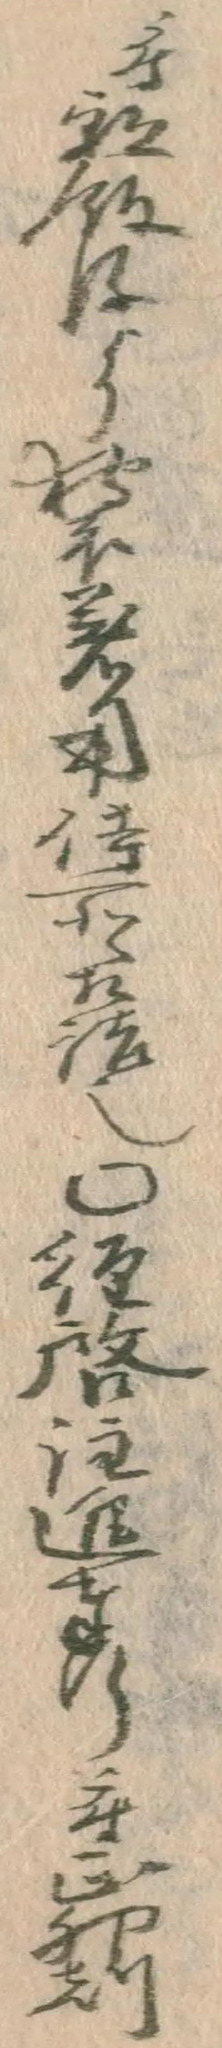ニ付朝飯後より狩衣着用侍所へ相詰也〇経啓注進奉行ニ付正卯刻
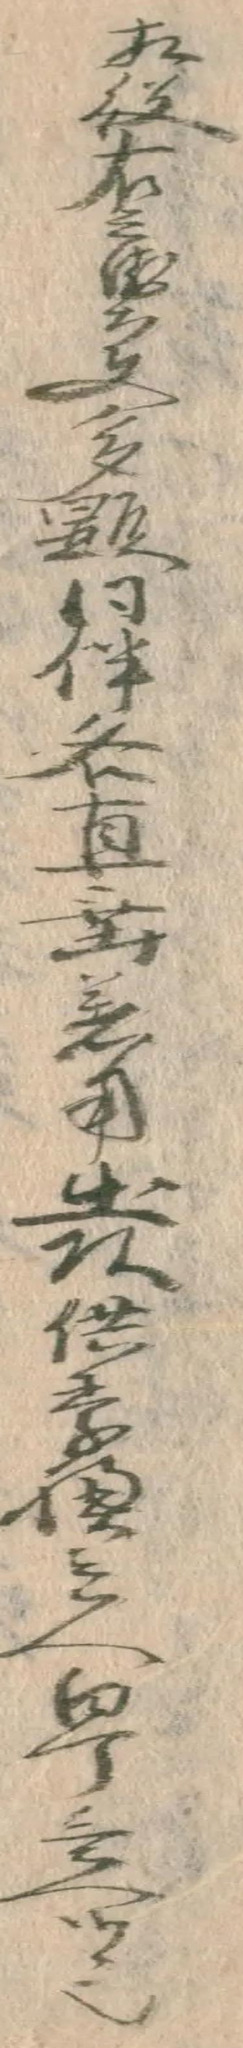相役右兵衛大夫多顕同伴各直垂着用出頭供素襖壱人白丁壱人ツヽ也
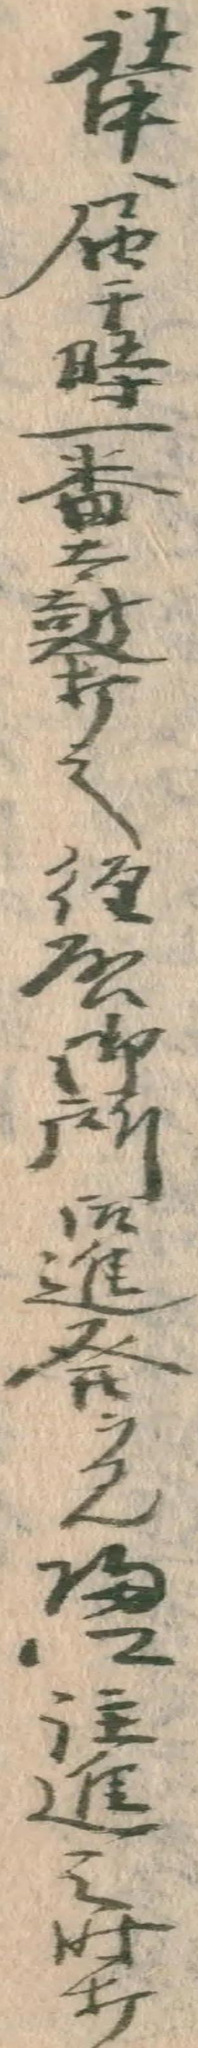社中へ届于時一番太鼓打也経啓御所御進発ヲ見帰郷注進之時打
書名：賀茂社記録. 第69冊
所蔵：国立国会図書館 National Diet Library, JAPAN
